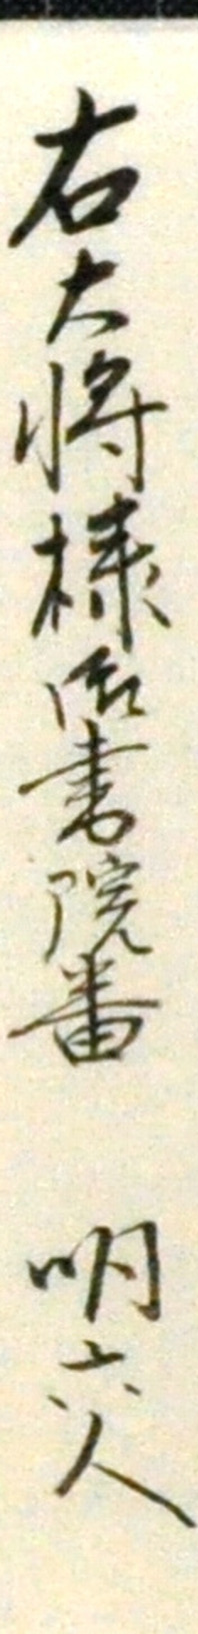右大将様御書院番明六人
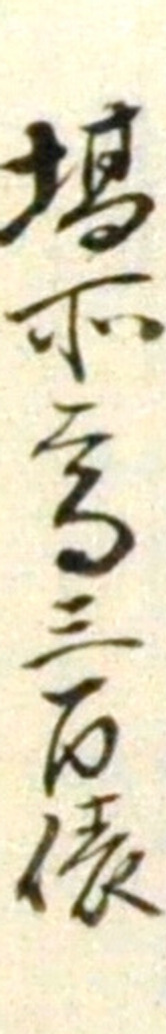場所高三百俵
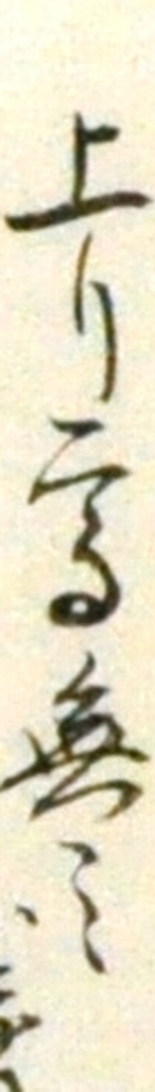上り高無之
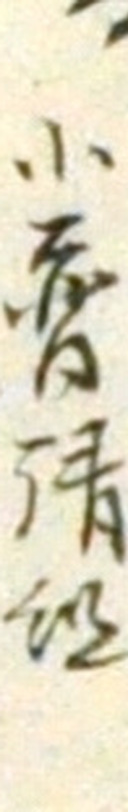小普請組
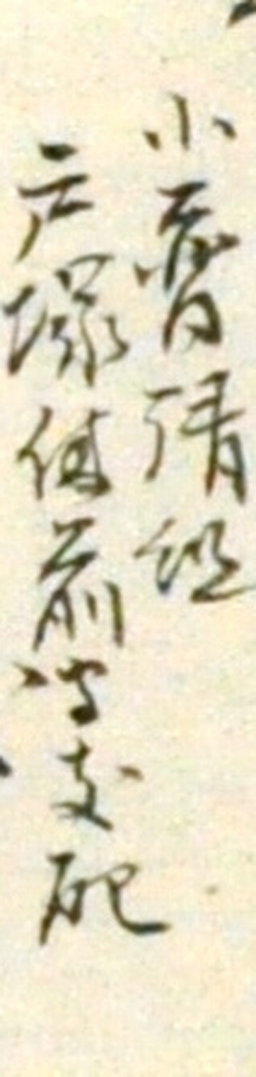戸塚備前守支配
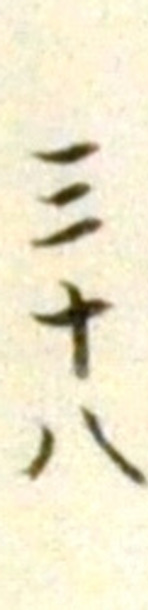三十八
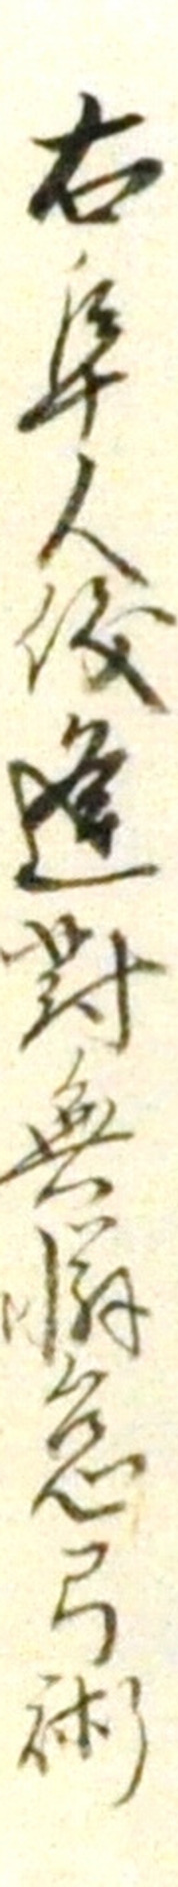右隼人儀逢対無懈怠弓術
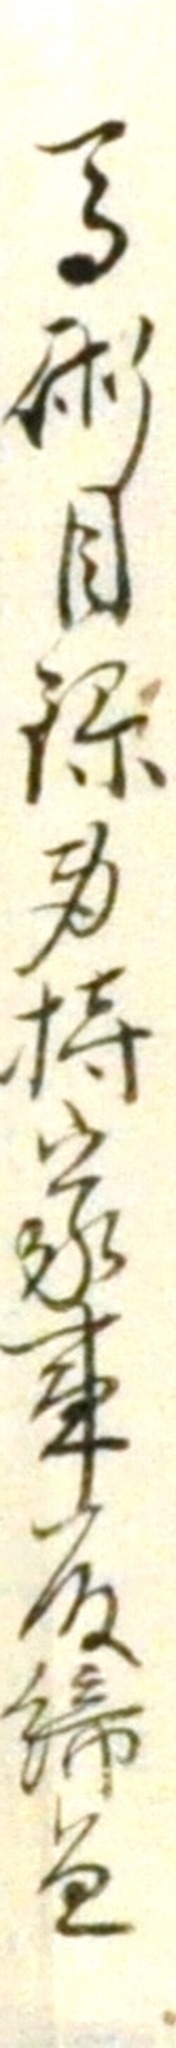馬術目録身持家事取締宜、
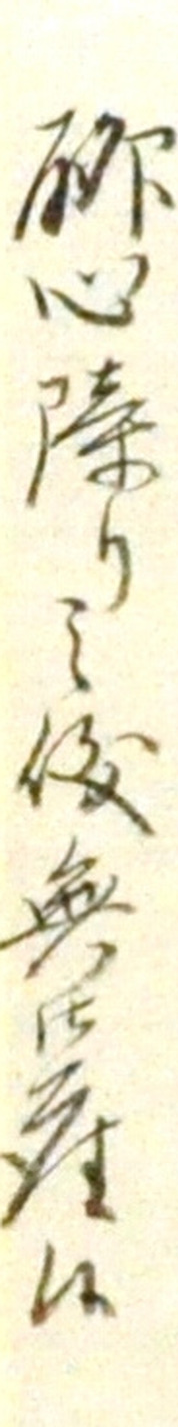聊心障り之儀無御座候
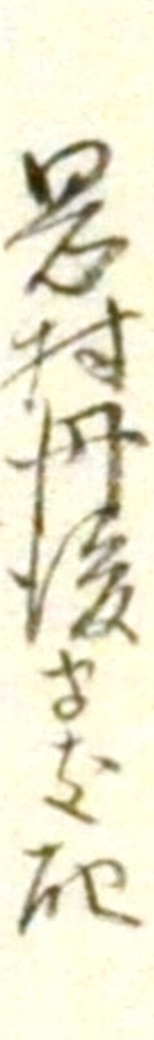岡村丹後守支配
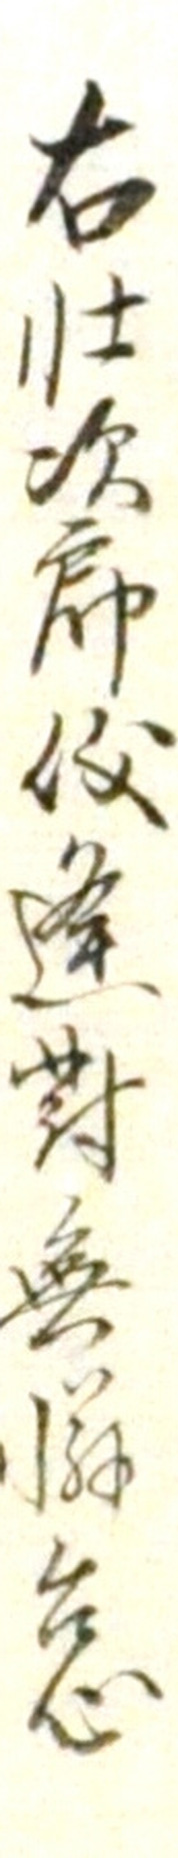右壮次郎儀逢対無懈怠
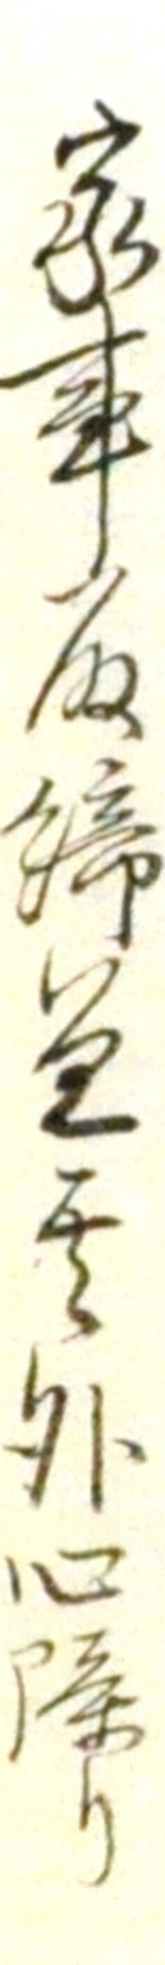家事取締宜其外心障り
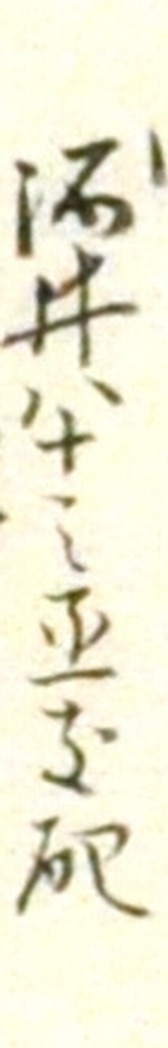酒井八十之丞支配
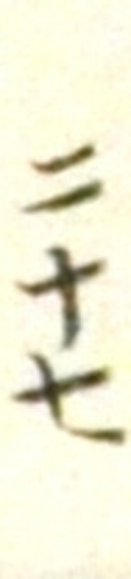二十七
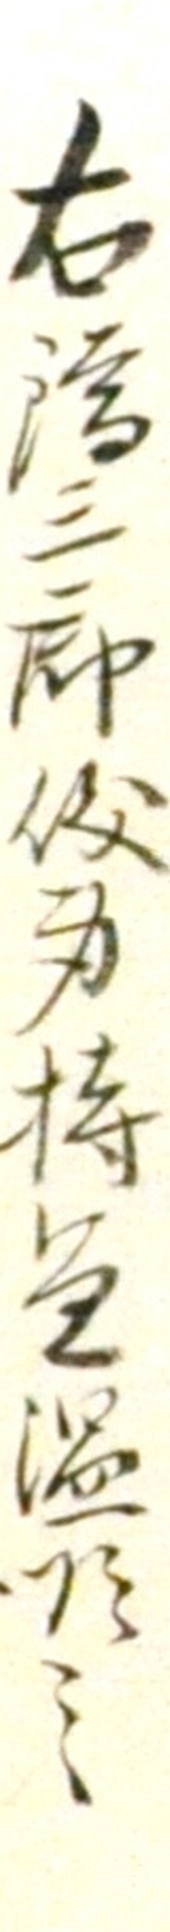右鎬三郎儀身持宜温順之
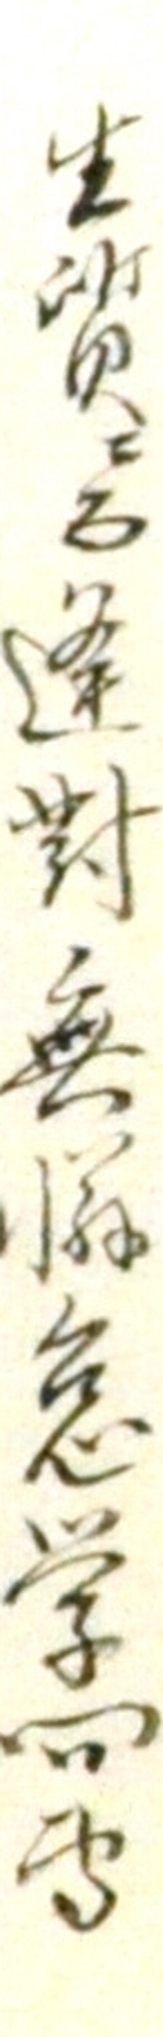生質ニ而逢対無懈怠学問専
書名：右大将様御書院番御入人調〔一括〕
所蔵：伊那市立高遠町図書館・合同会社AMANE
